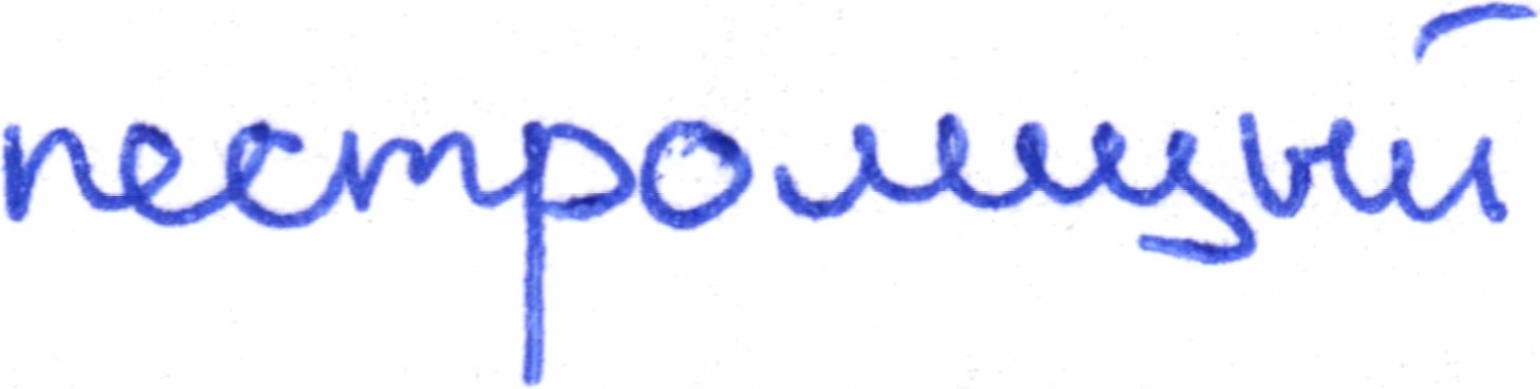пестролицый
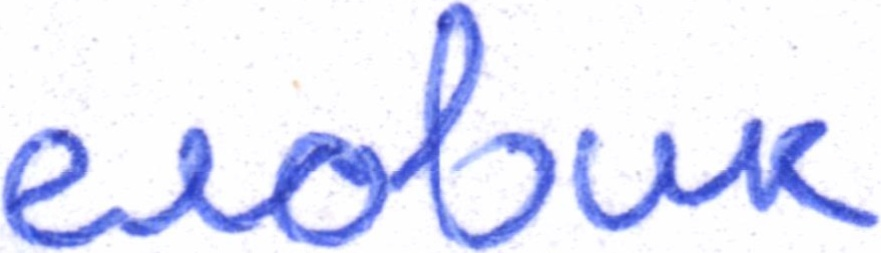еловик
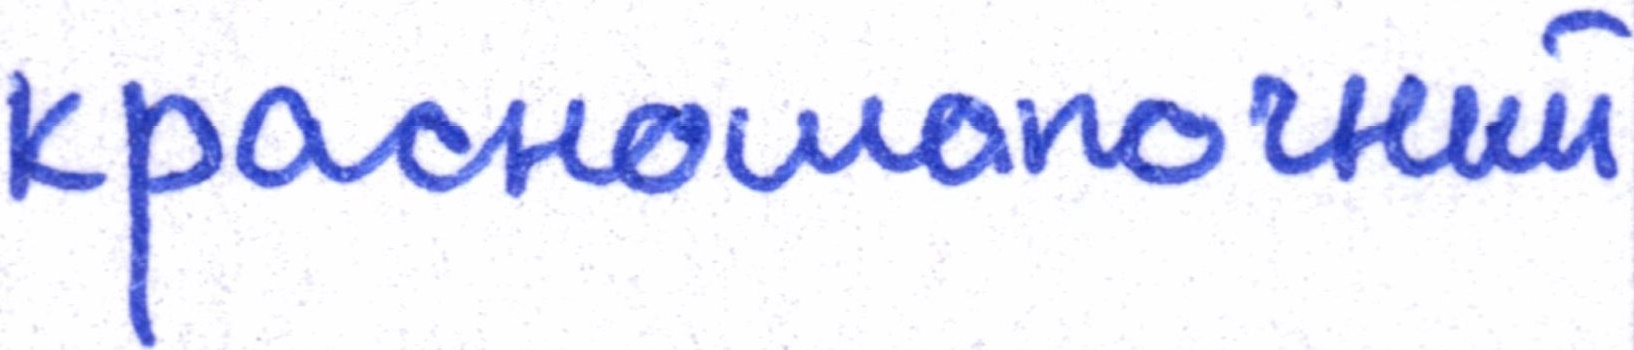красношапочный
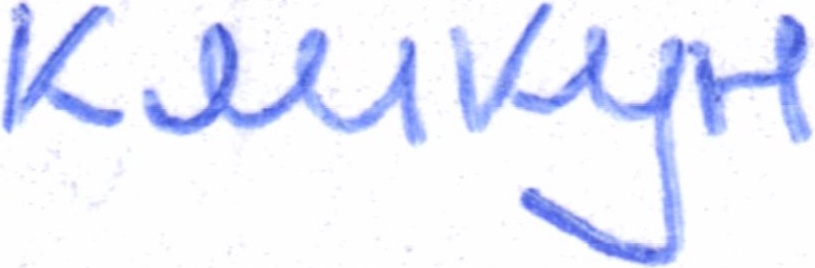кликун
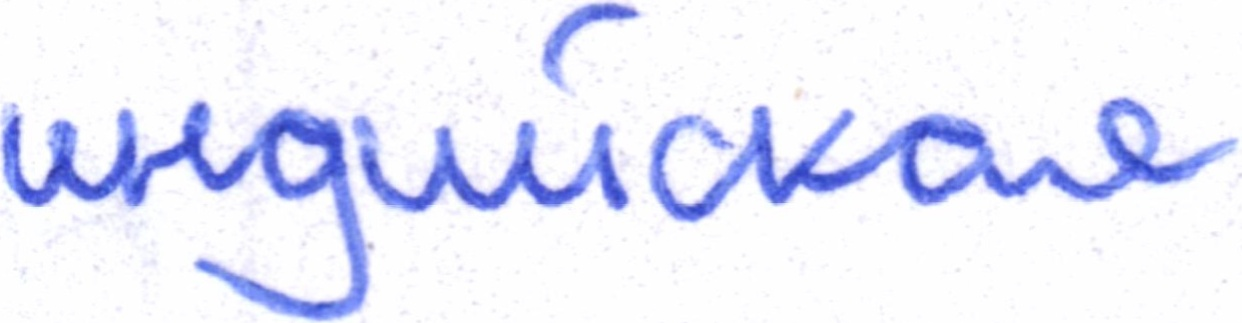индийская
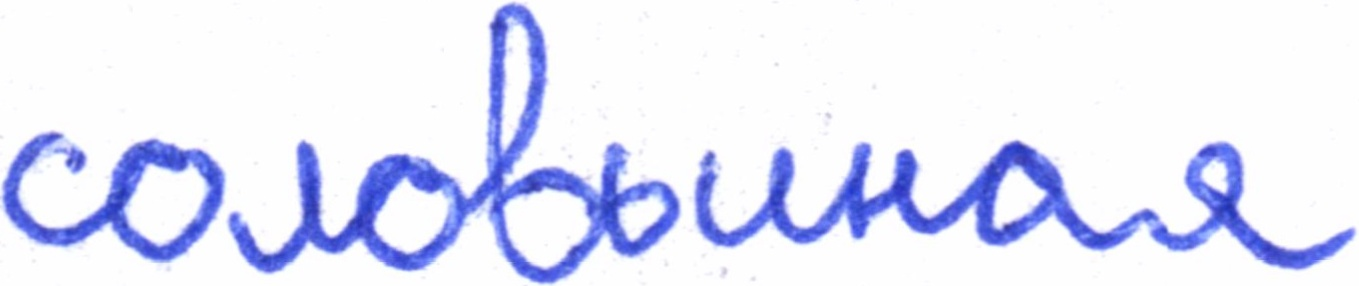соловьиная
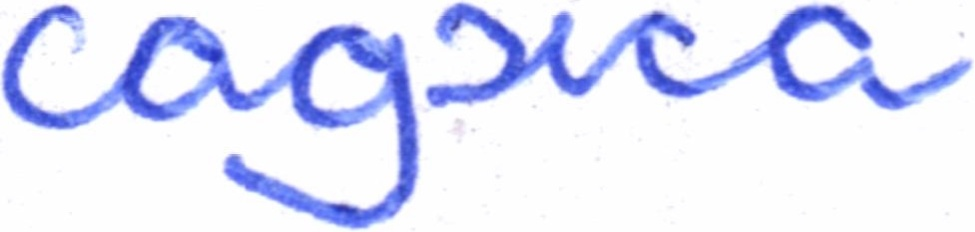саджа
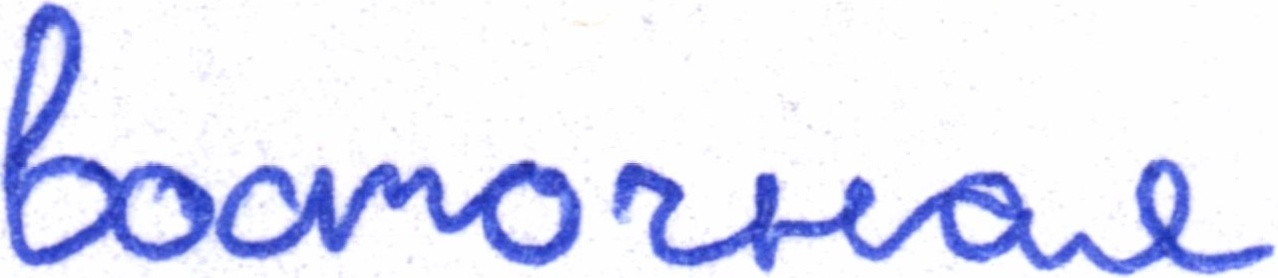восточная
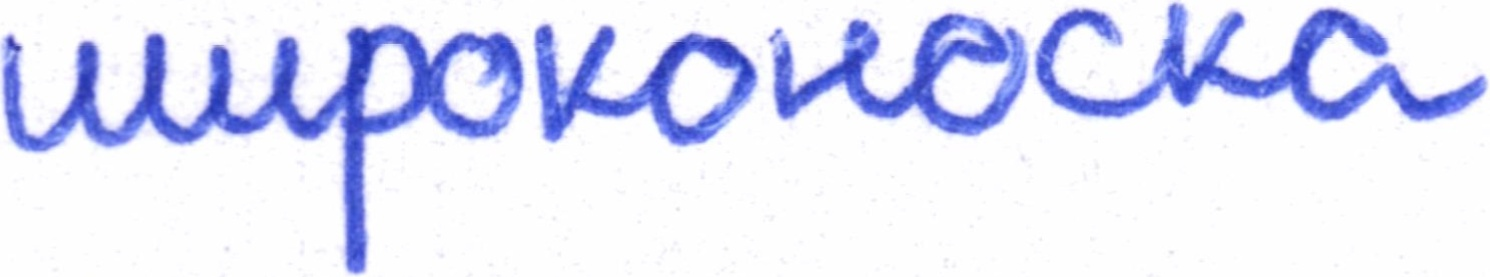широконоска
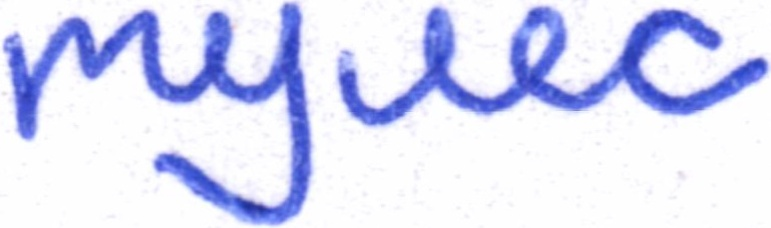тулес
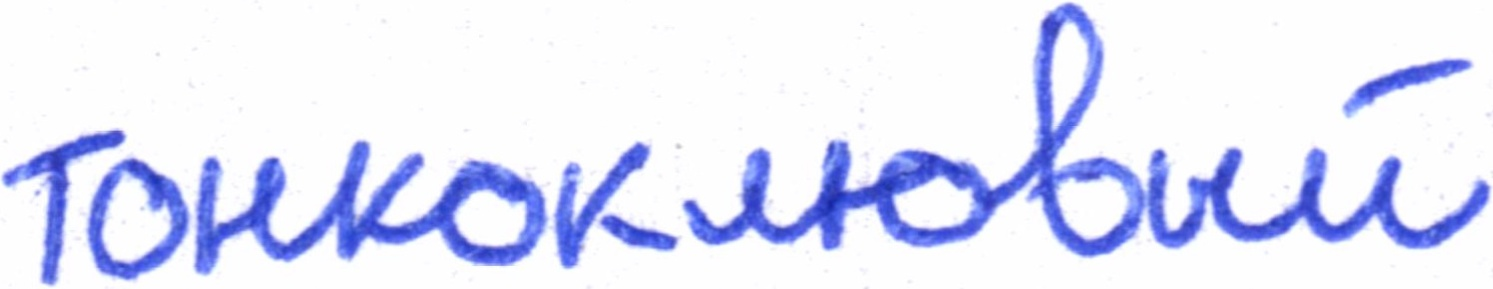тонкоклювый
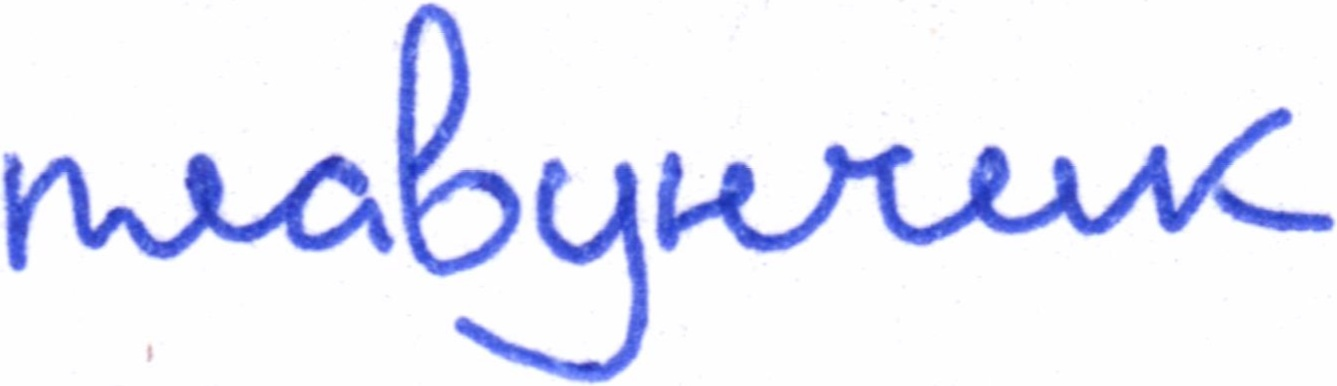плавунчик
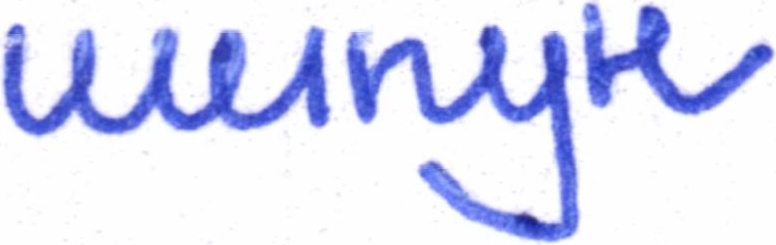шипун
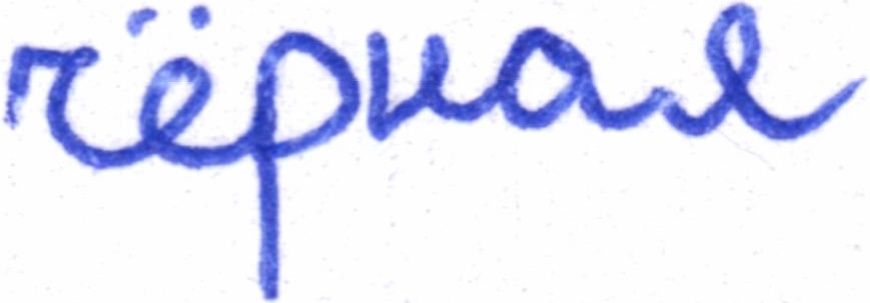чёрная
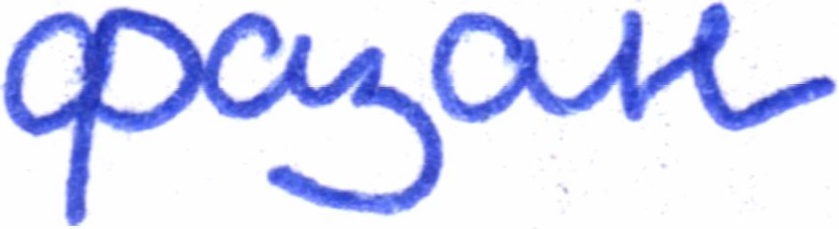фазан
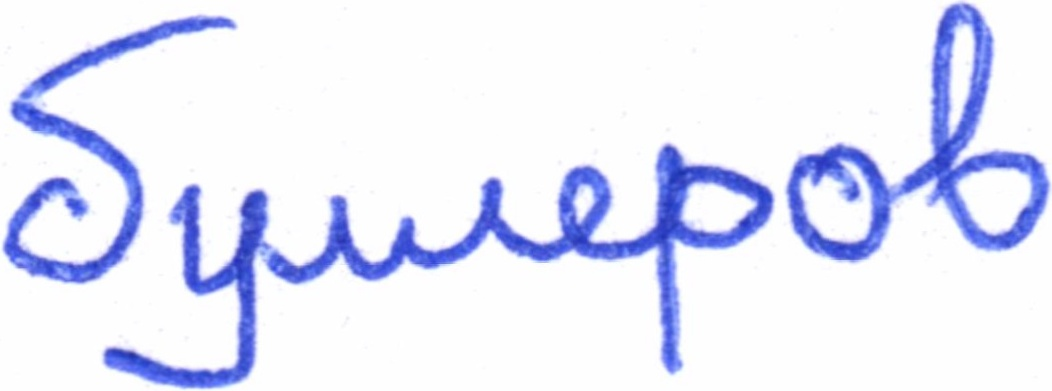буллеров
